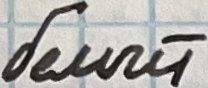белый
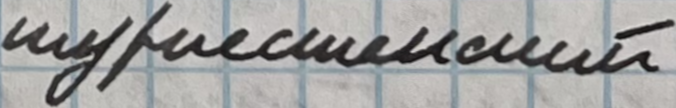туркестанский
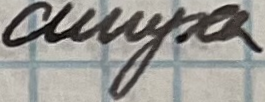сипуха
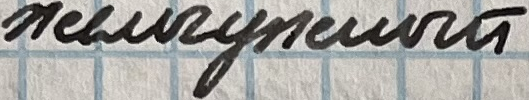жемчужный
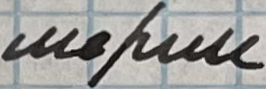люрик
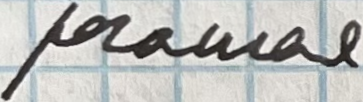рогатая
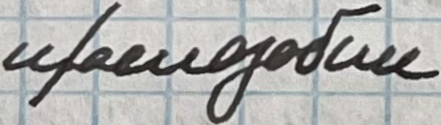краснозобик
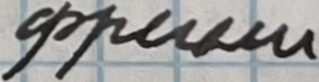фрегат
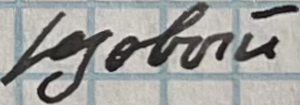розовый
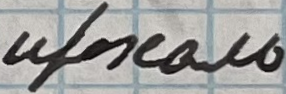крохаль
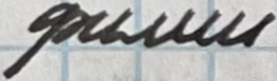филин
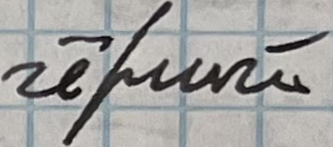чёрный
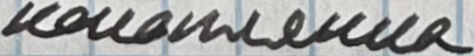коноплянка
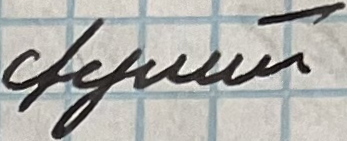средний
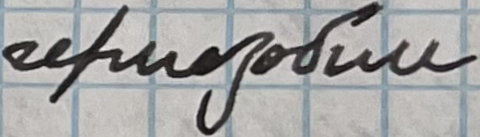чернозобик
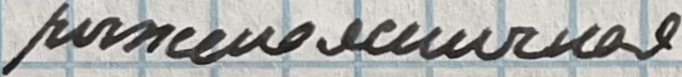рыжепоясничная
